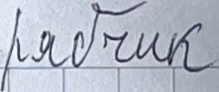рябчик
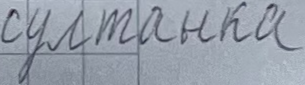султанка
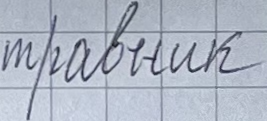травник
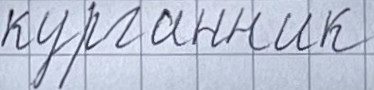курганник
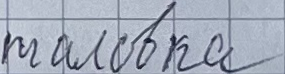таловка
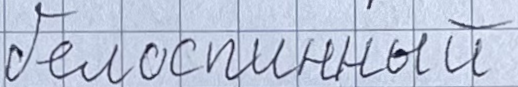белоспинный
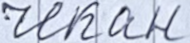чекан
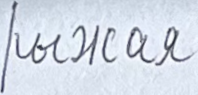рыжая
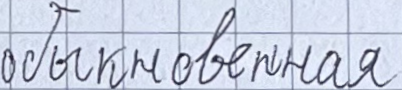обыкновенная
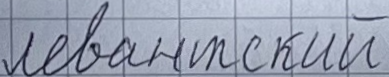левантский
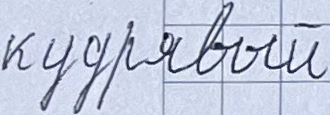кудрявый
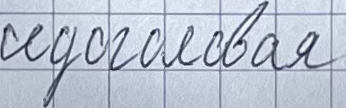седоголовая
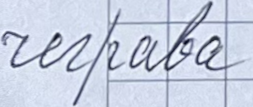чеграва
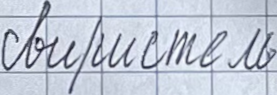свиристель
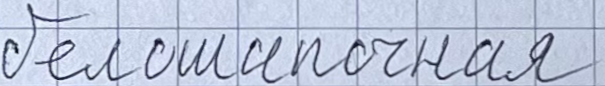белошапочная
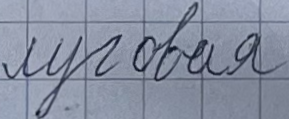луговая
